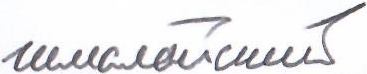гималайский
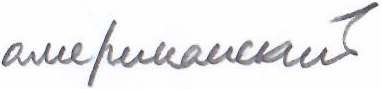американский
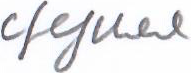средняя
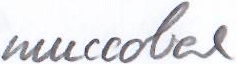тиссовая
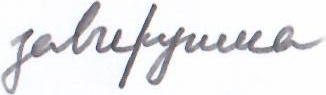завирушка
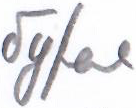бурая
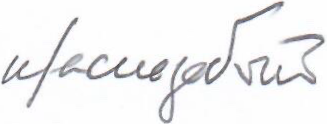краснозобый
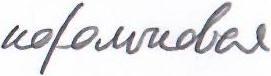корольковая
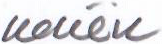конёк
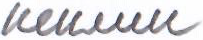кеклик
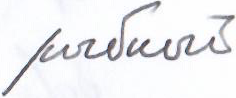рыбный
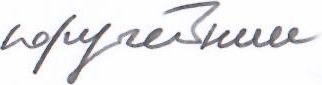поручейник
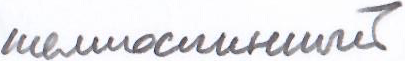темноспинный
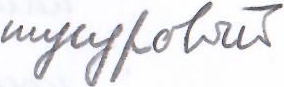тундровый
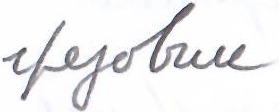грязовик
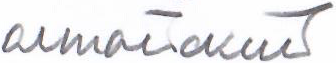алтайский
